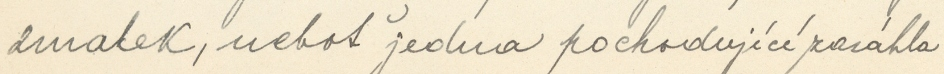zmatek, neboť jedna pochodující zasáhla
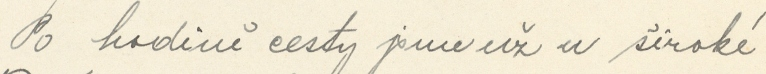Po hodině cesty jsme už u široké
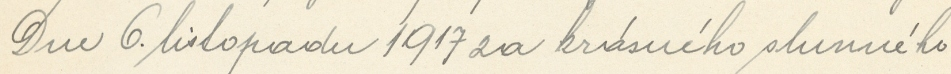Dne 6. listopadu 1917 za krásného slunného
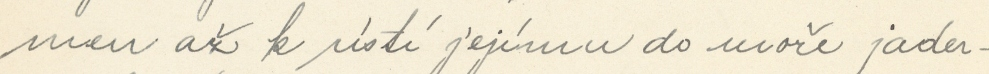men až k ústí jejímu do moře jader-
